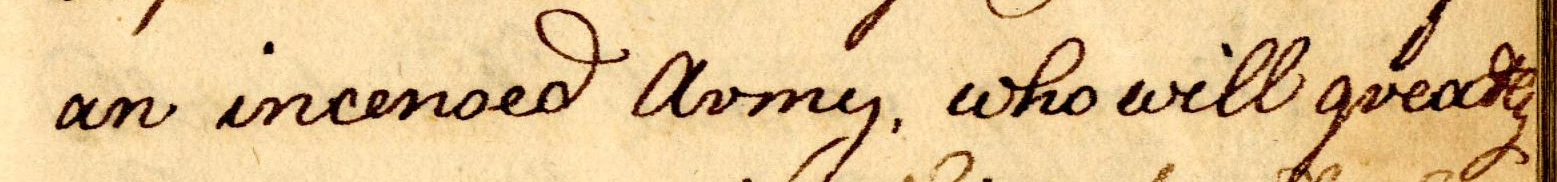an incensed Army, who will greatly
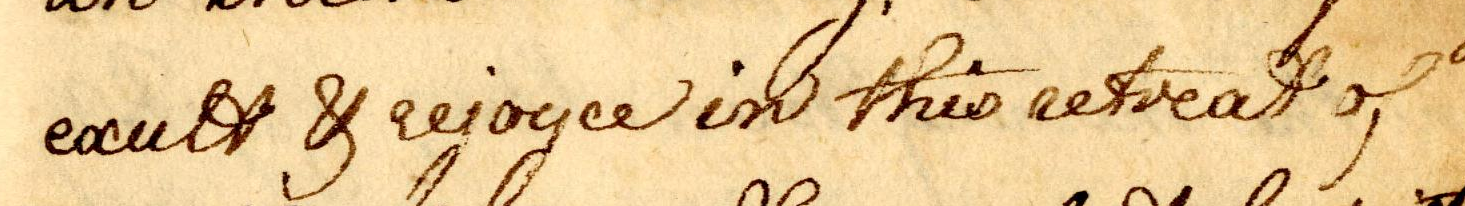exult & rejoyce in this retreat of
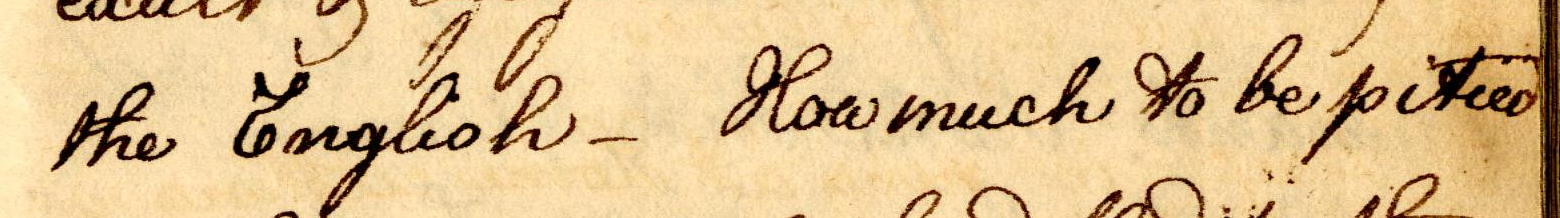the English- How much to be pitied
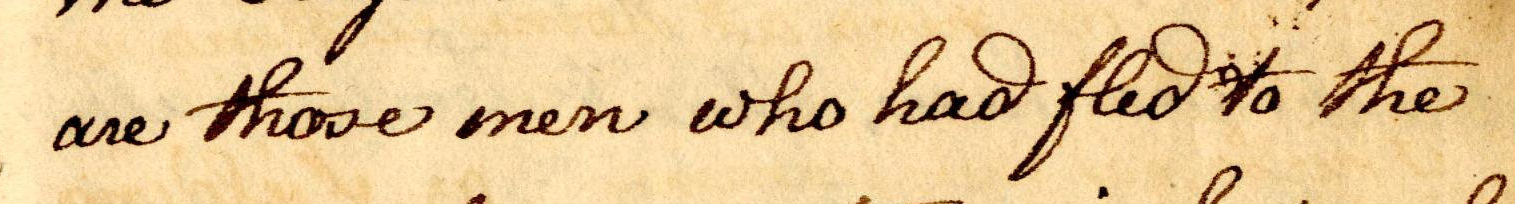are those men who had fled to the
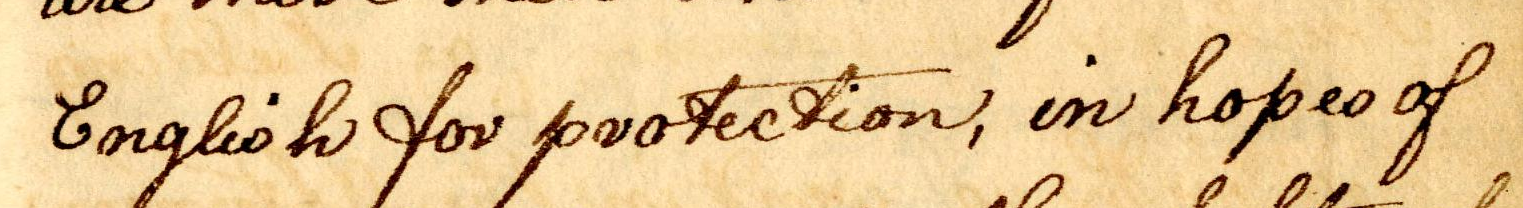English for protection, in hopes of
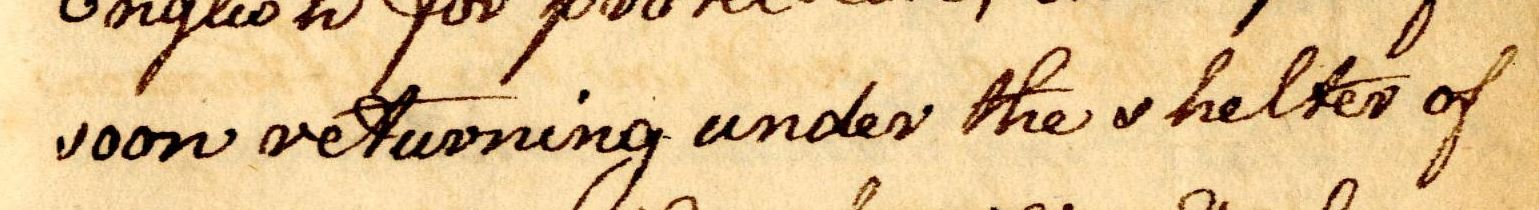soon returning under the shelter of
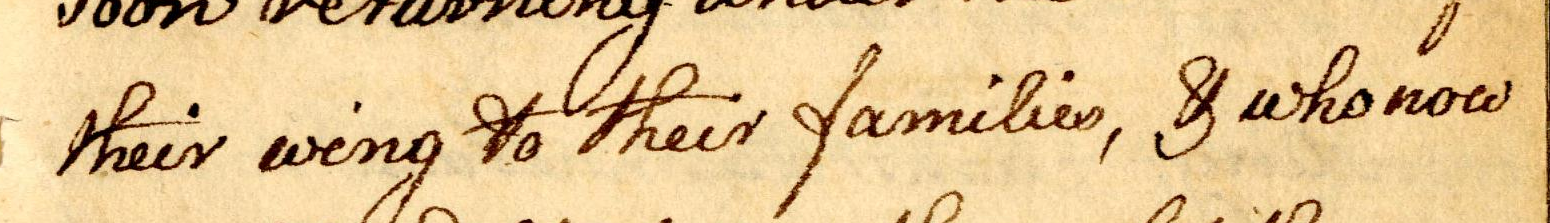their wing to their families, & who now
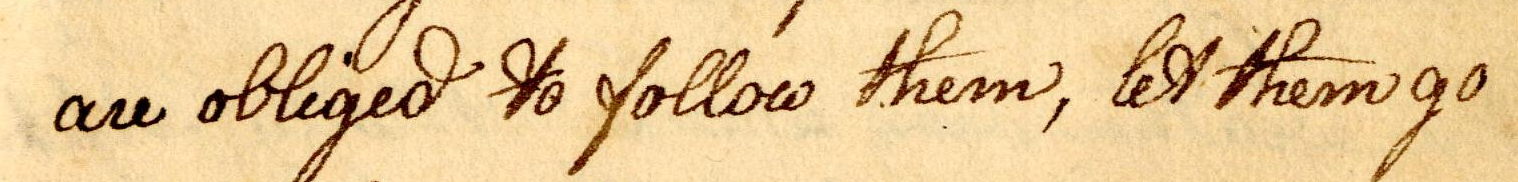are obliged to follow them, let them go
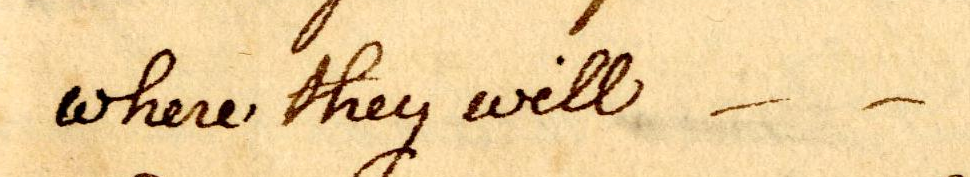where they will--
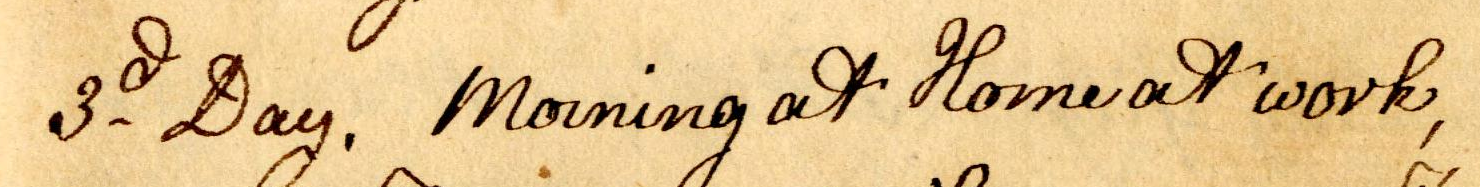3^d Day. Morning at Home at work,
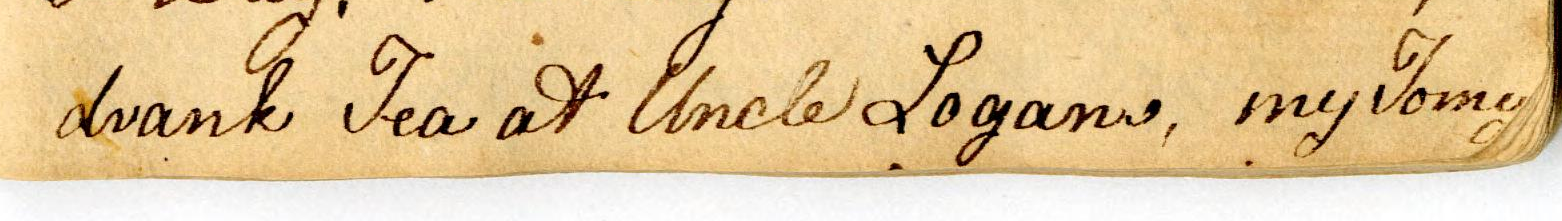drank Tea at Uncle Logans, my Tomy
